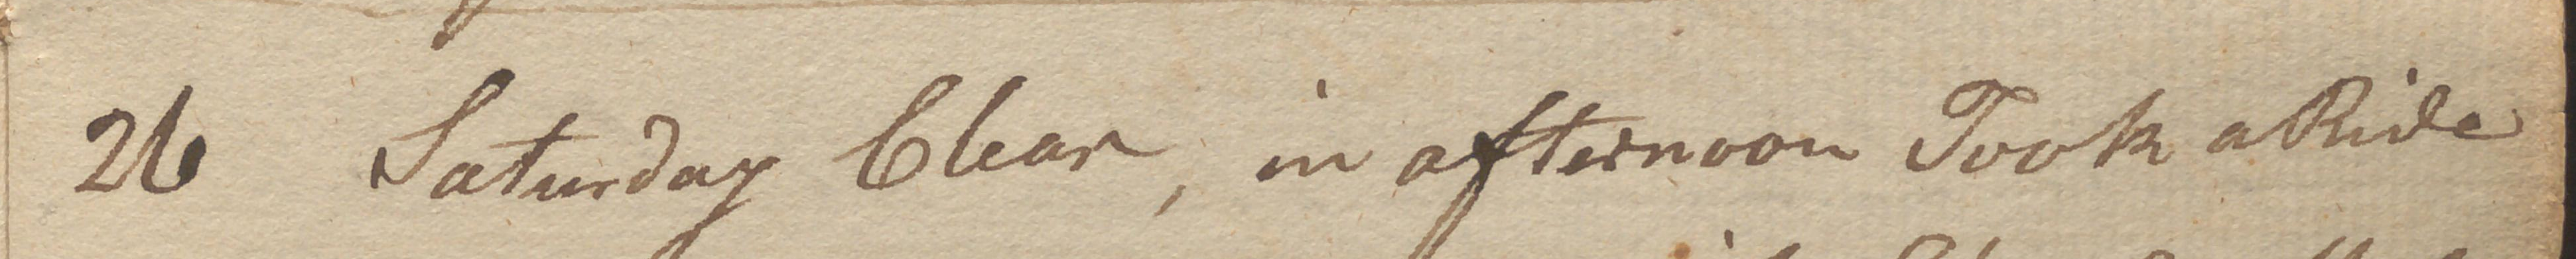26 Saturday Clear, in afternoon Took a Ride
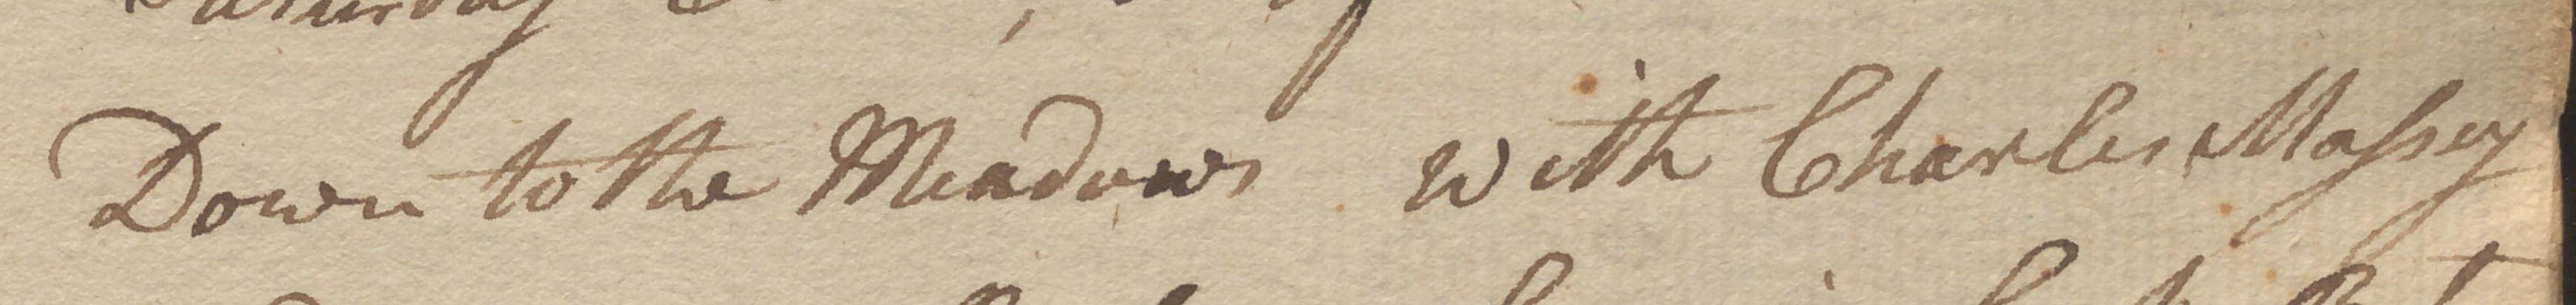Down to the Meadows with Charles Massey
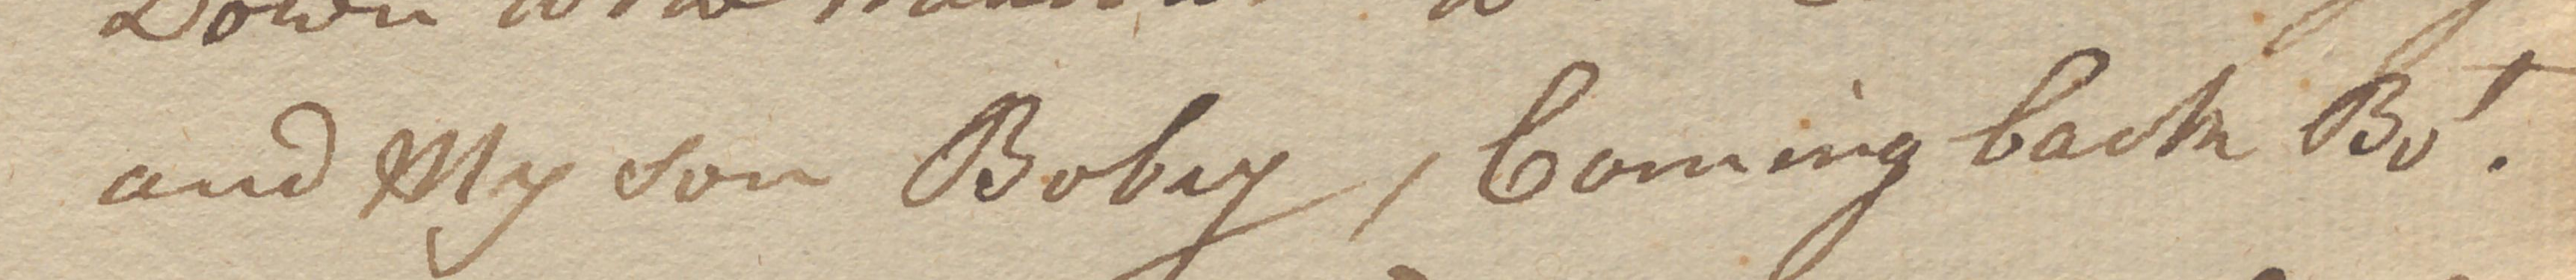and My son Bobey, Coming back Bo^t.
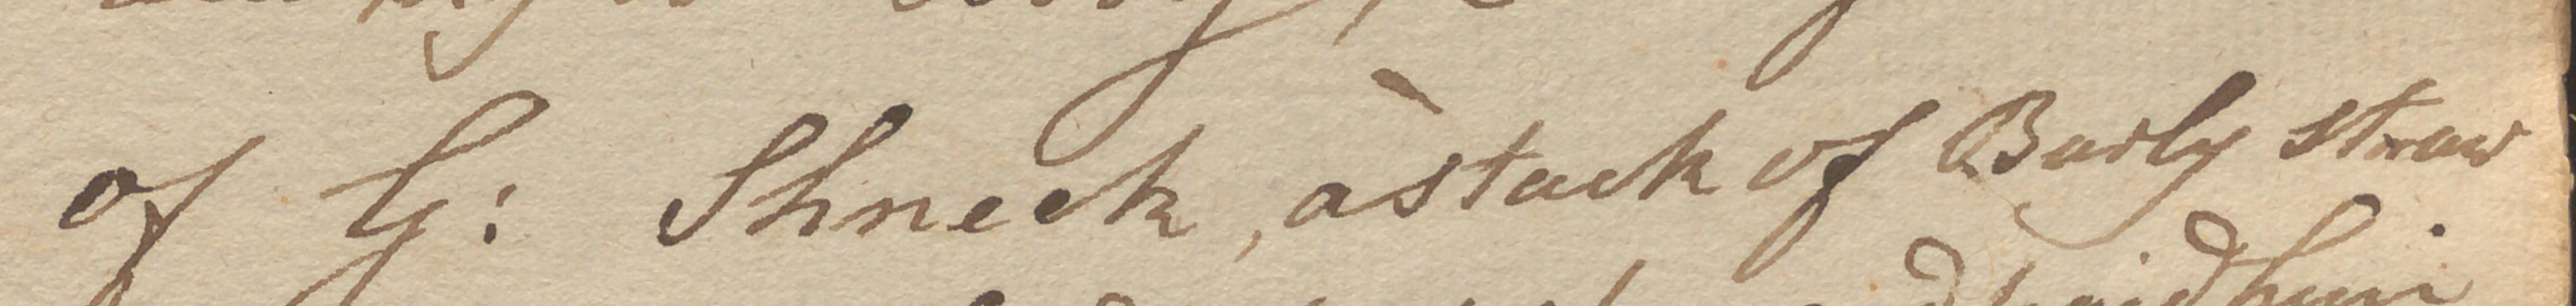of G: Shneck a stack of Barly straw
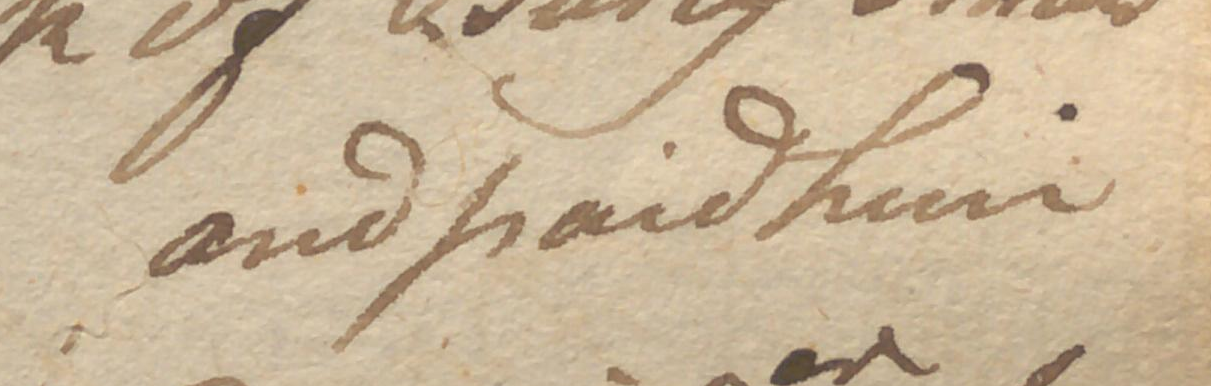and paid him
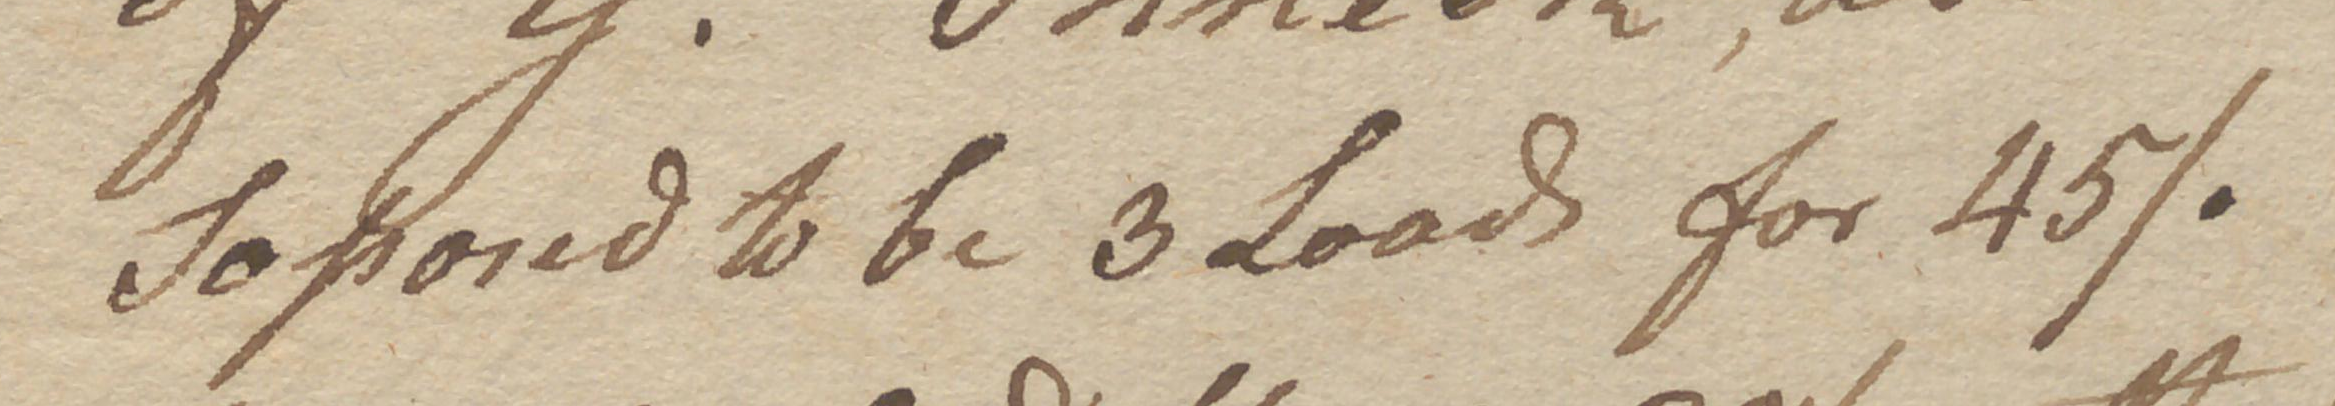soposed to be 3 Loads for 45s.
